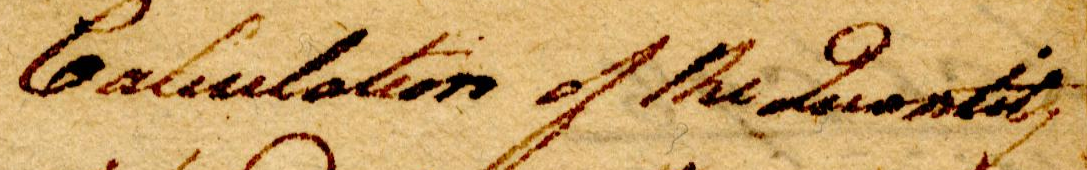Calculation of the quantity
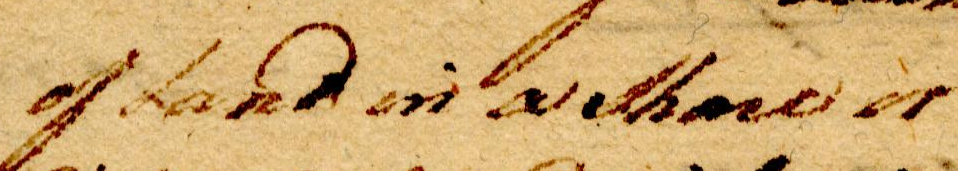of Land in a share or
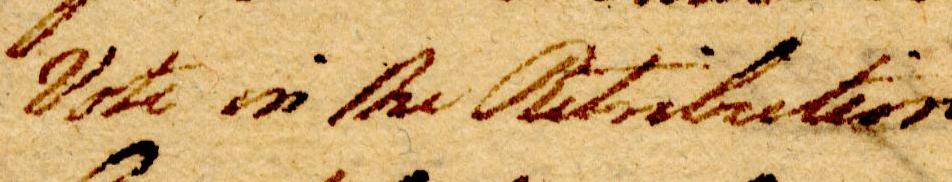vote in the Retribution
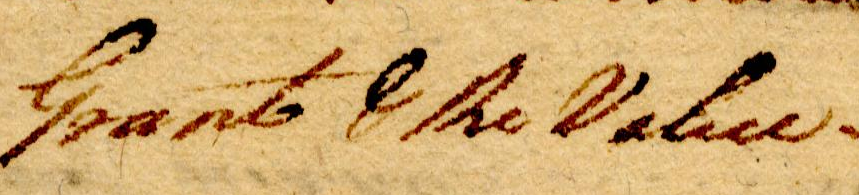Grant & the Value
